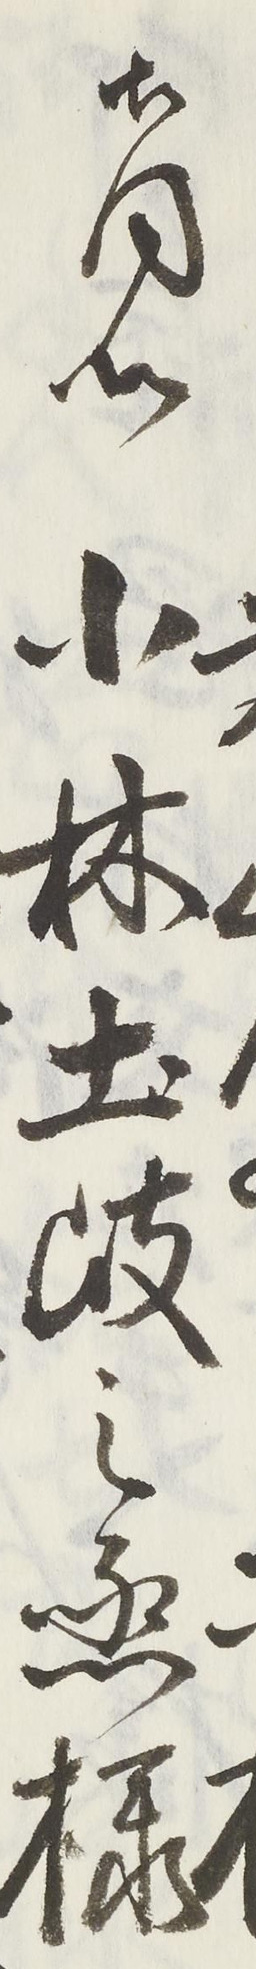御同心小林土岐之丞様
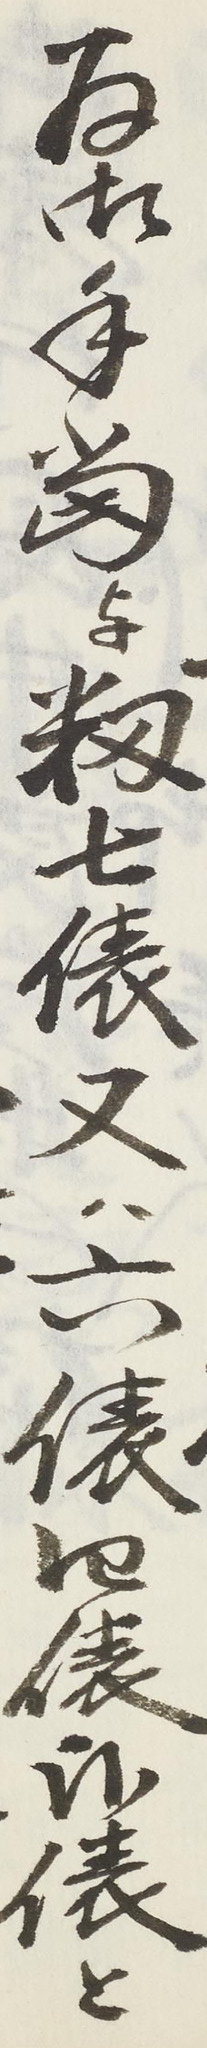為御手当と籾七俵又ハ六俵四俵弐俵と
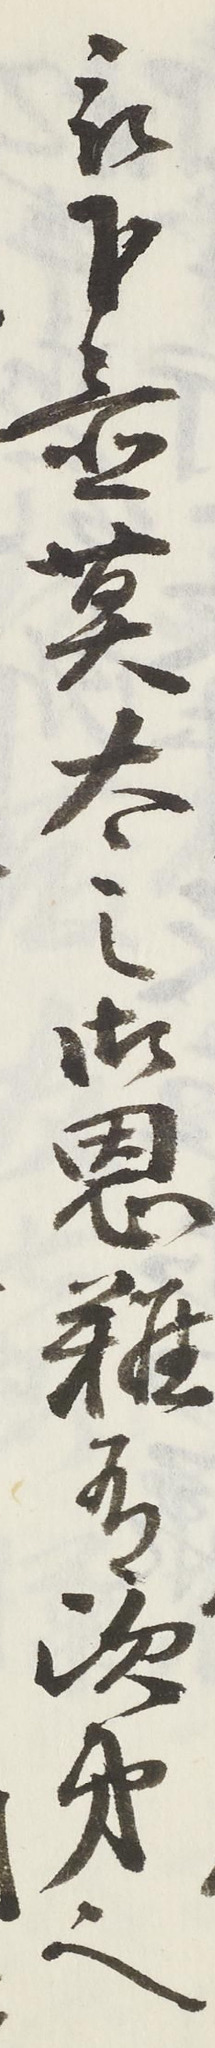被下置莫太之御恩難有次第也
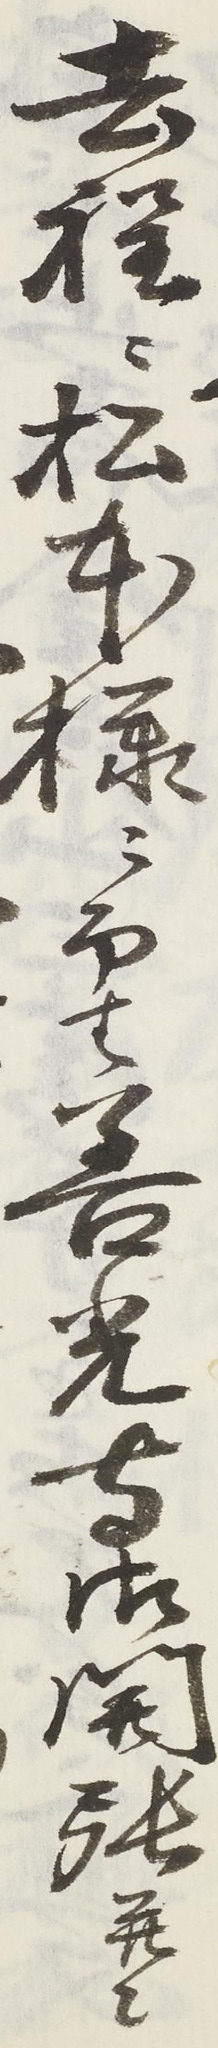去程二松本様二而は善光寺御開張并二
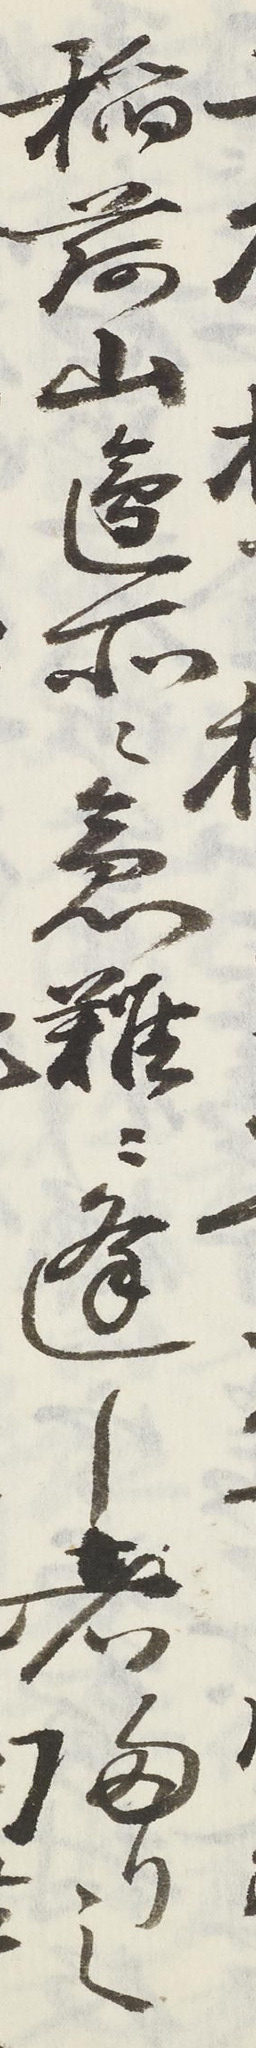稲荷山辺所々急難二逢し者帰り之
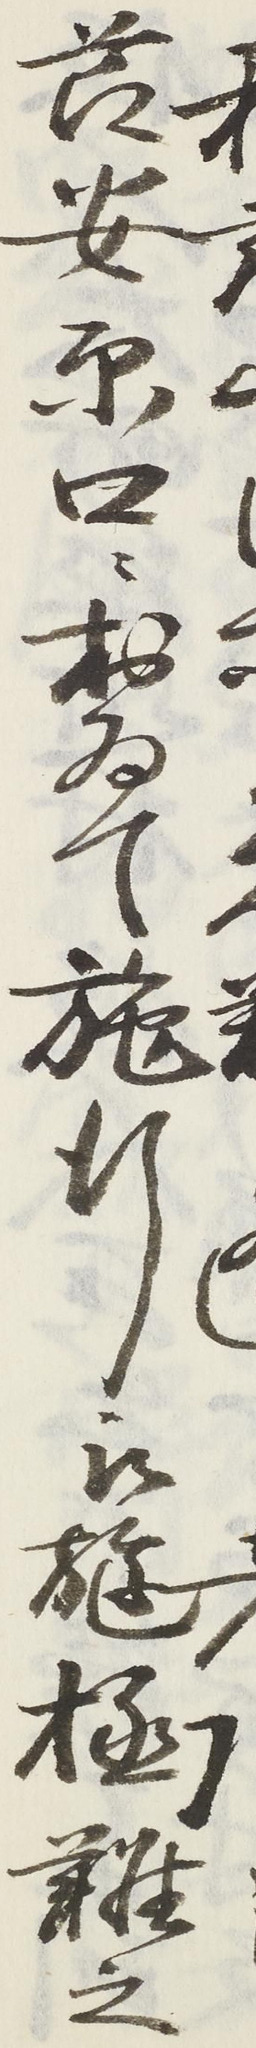節安原口二おゐて施行被遊極難之
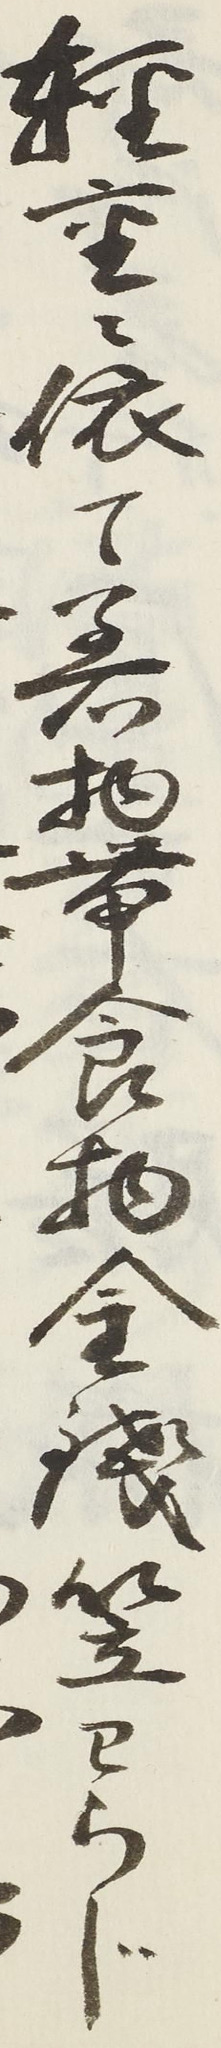軽重二依て着物帯食物金銭笠わらじ
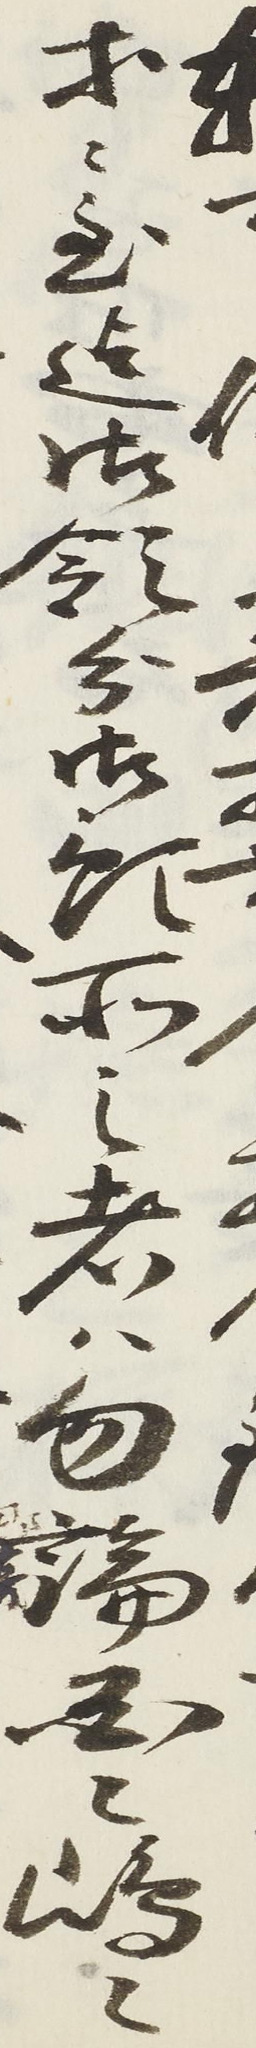等二至迄御領分御預所之者ハ勿論国々嶋々
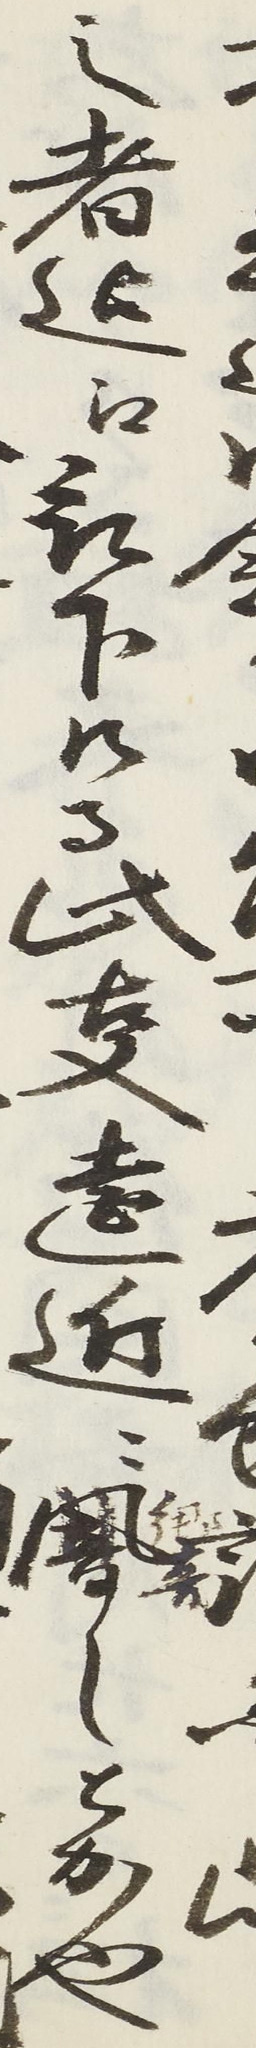之者迄江被下ける此事遠近二響しとかや
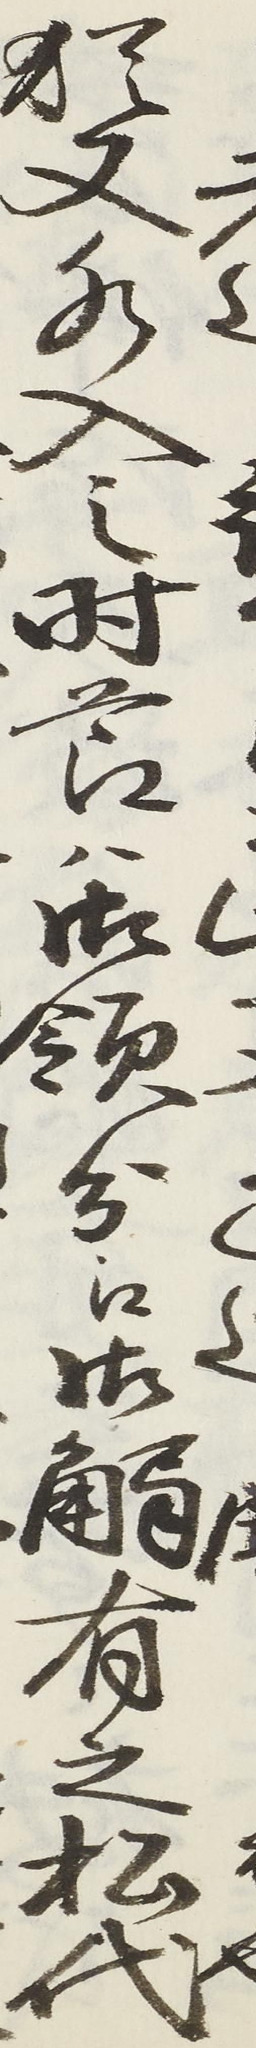猶又水入之時節ハ御領分江御触有之松代
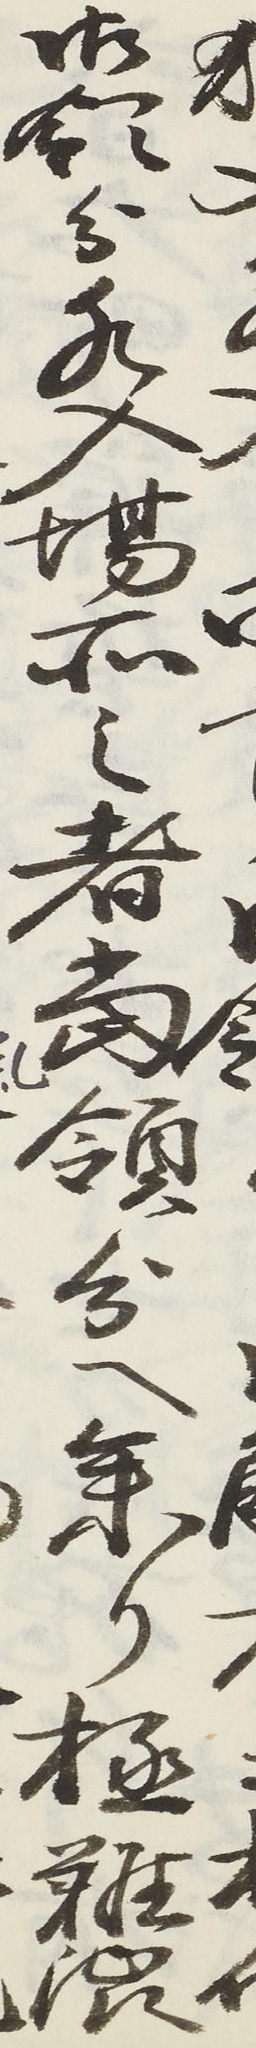御領分水入場所之者当領分へ参り極難渋
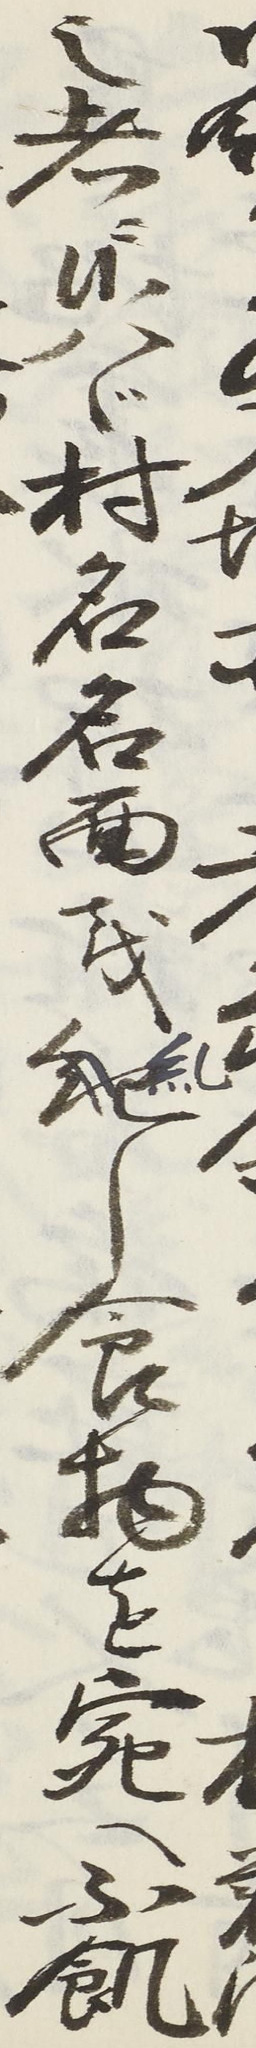之者二候ハゞ村名名面も糺し食物を宛へ不飢
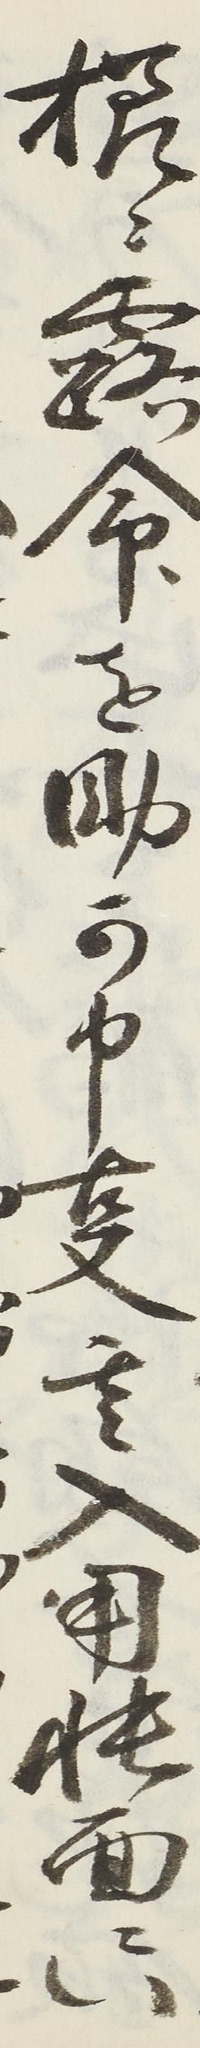様二露命を助可申事は入用帳面二い
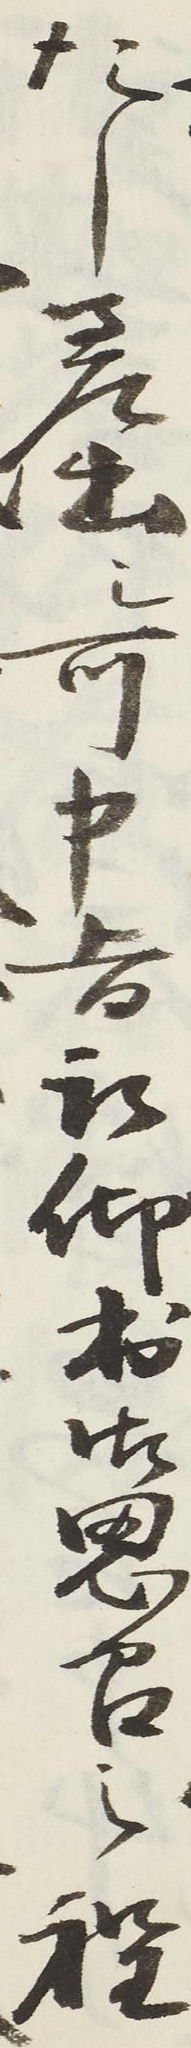たし差出ㇱ可申旨被仰出御思召之程
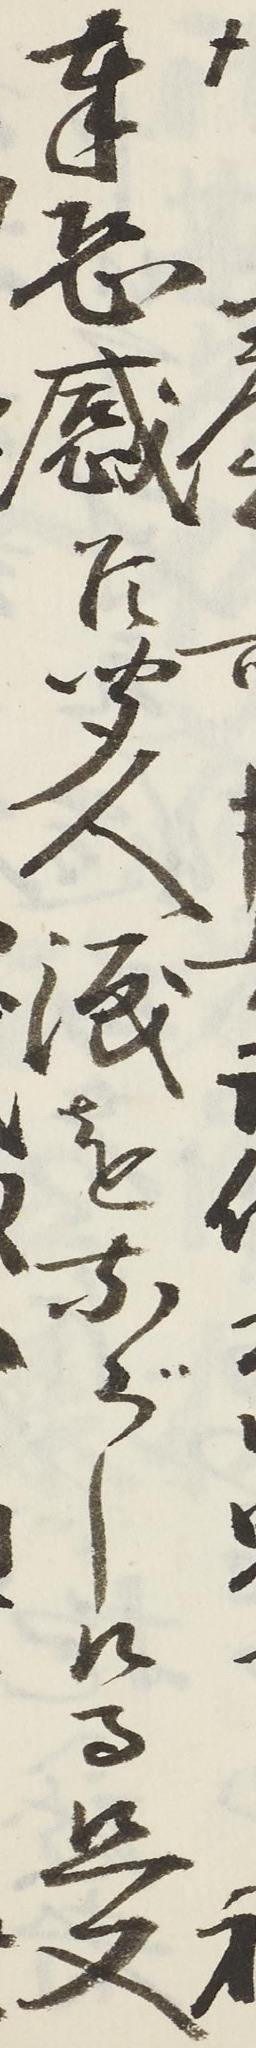奉恐感候聞人涙をながしける且又
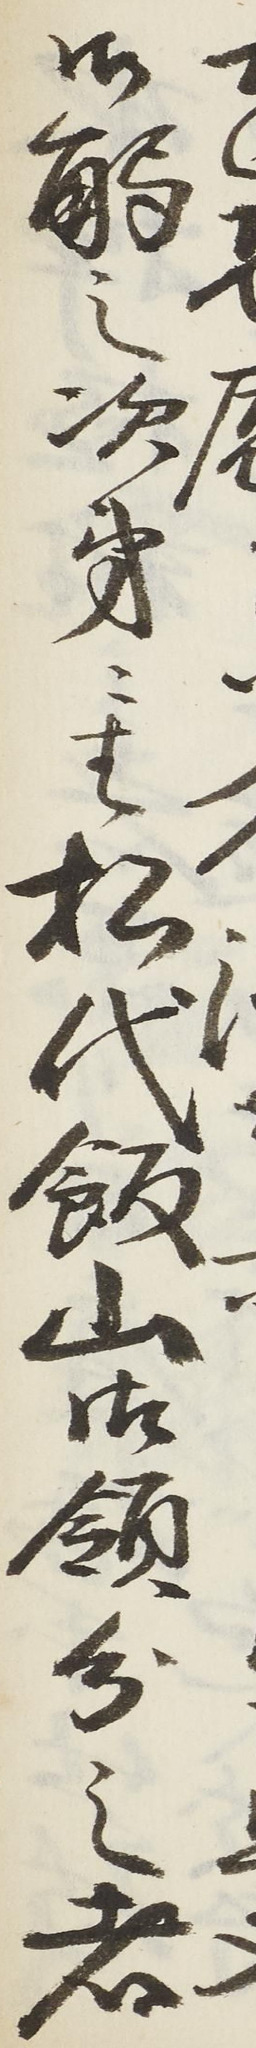御觸之次第二は松代飯山御領分之者
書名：弘化四年地震記
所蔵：東京大学地震研究所図書室 Earthquake Research Institute Library, The University of Tokyo, JAPAN
